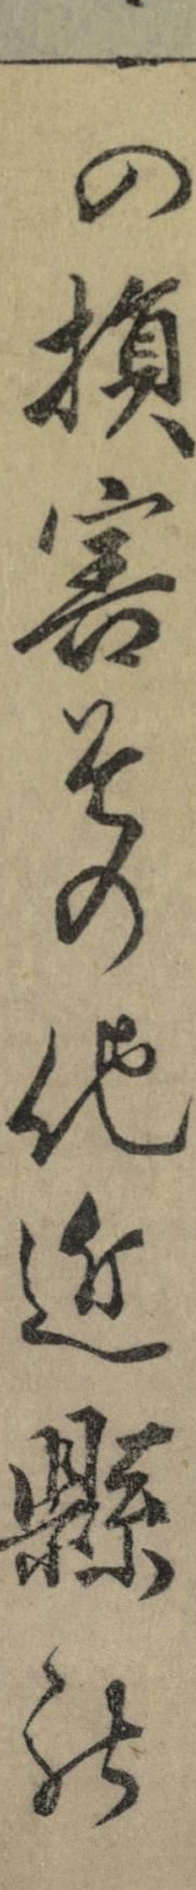の損害その他近県の
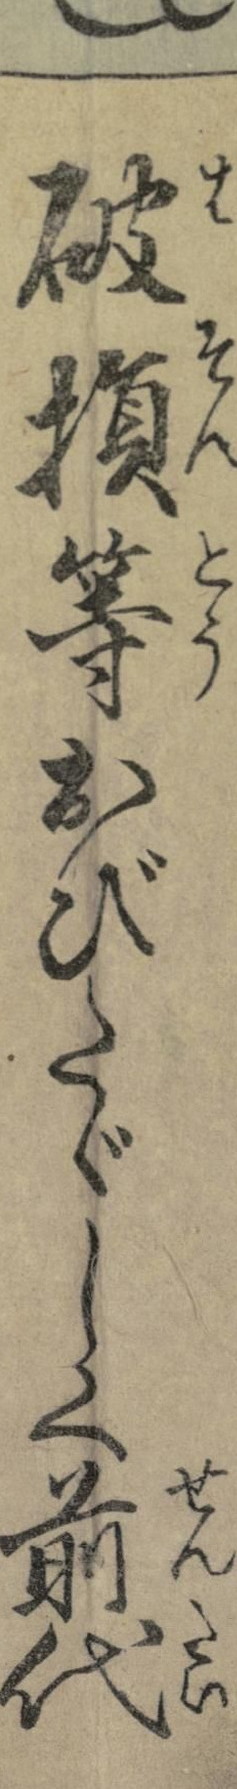破損等おびたゞしく前代
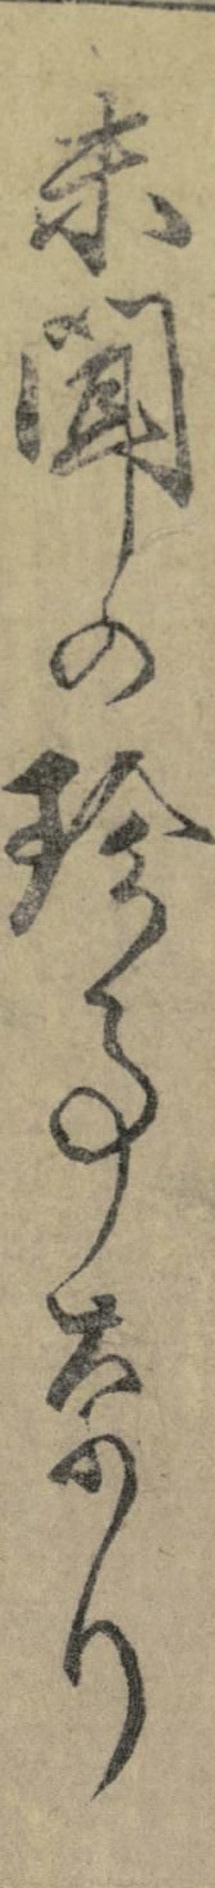未聞の珍事なり
